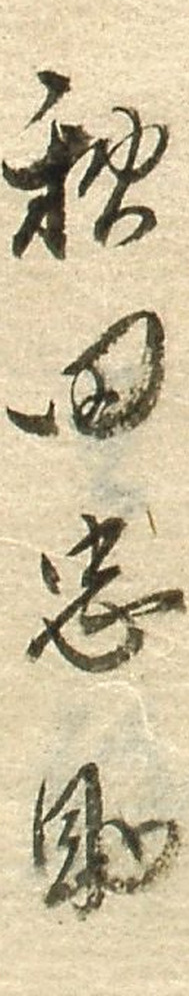秋田忠助
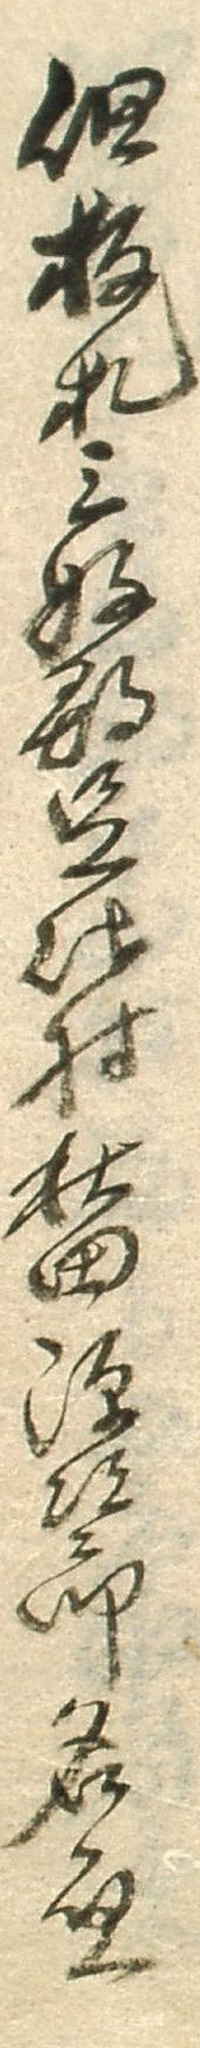但板札三好郡豆代村秋田源次郎名
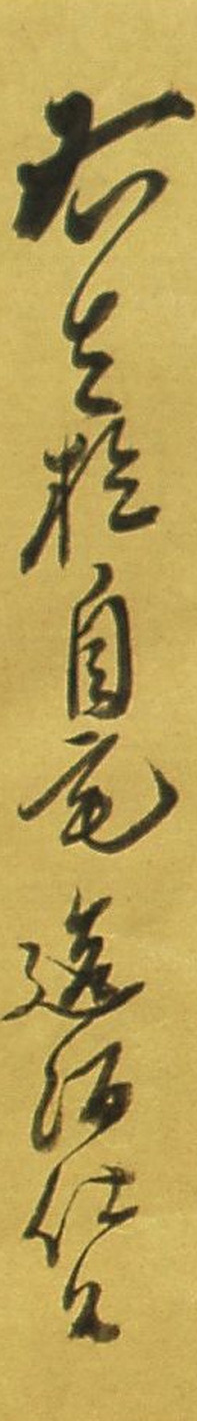右は於自宅造酒仕候

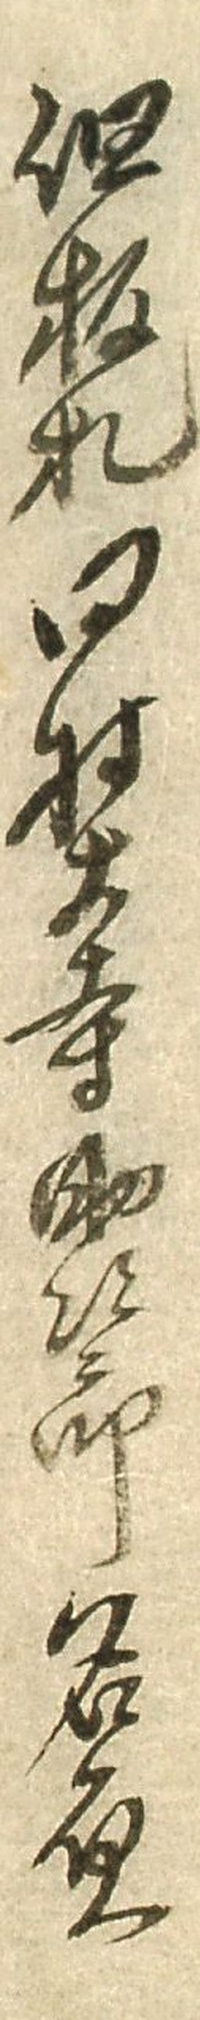但板札同村大寺助次郎名
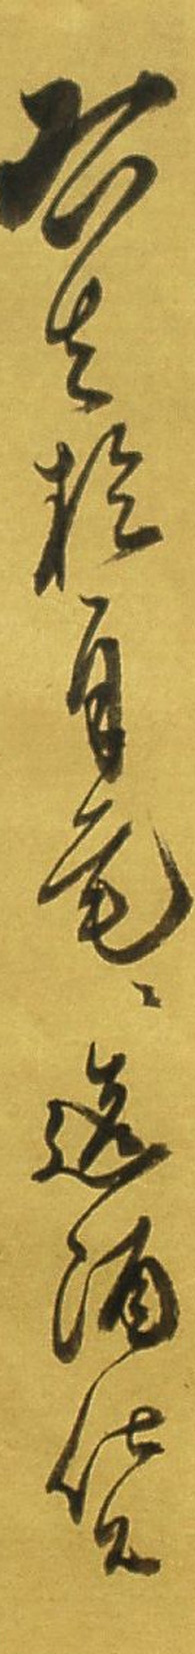右は於自宅に造酒仕候
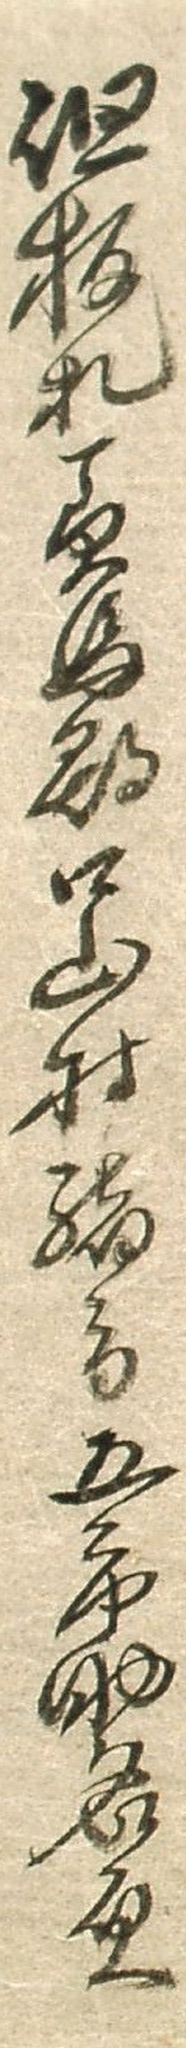但板札美馬郡口山村緒方五郎助名
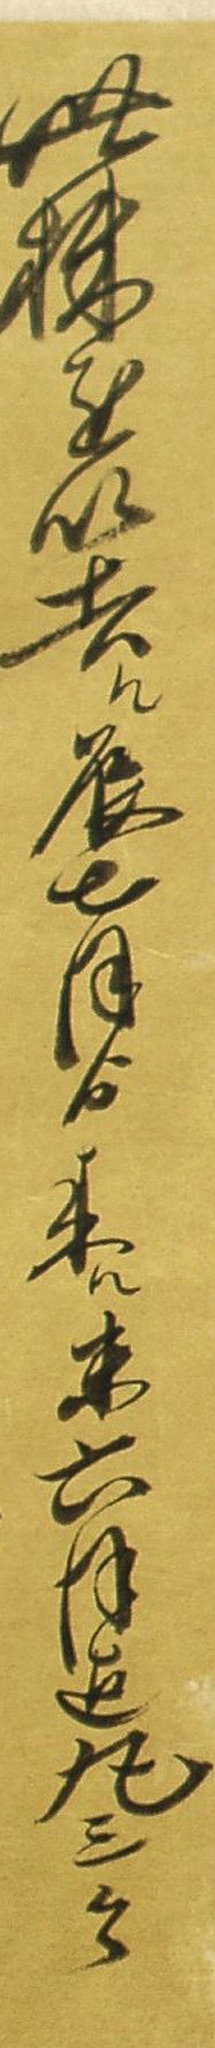此株を以去る辰七月より来る未六月迄丸三ヶ
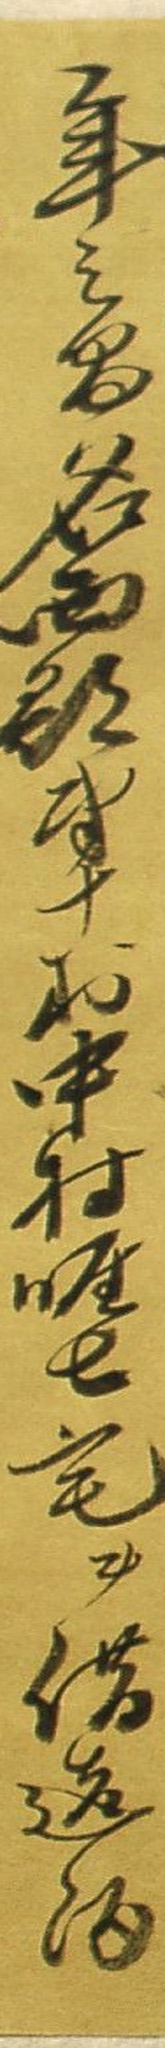年之間名西郡第十村中村唯七宅を借造酒
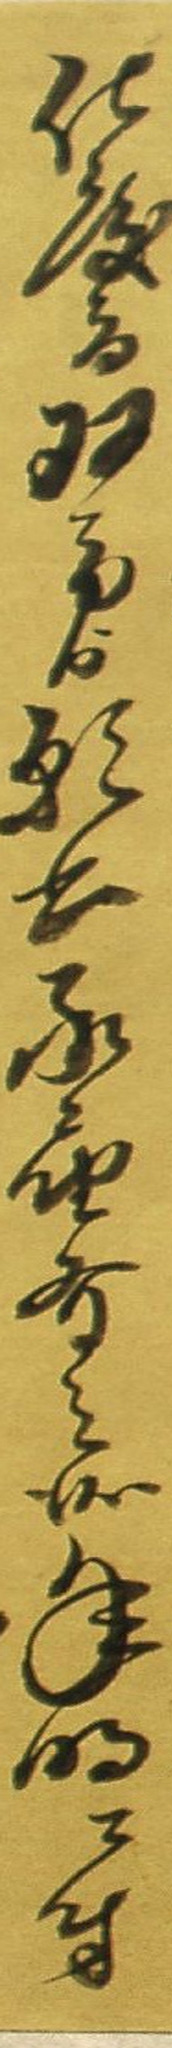仕度旨双方より願出承届有之候所年明に付
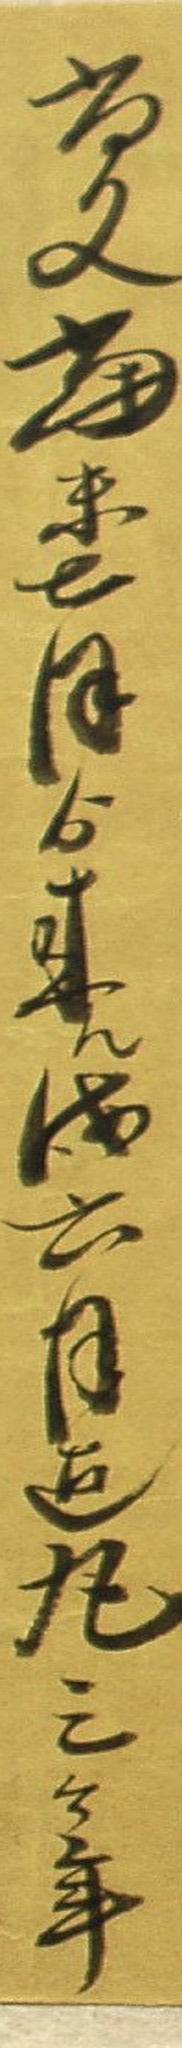尚又当未七月より来る戌六月迄丸三ヶ年
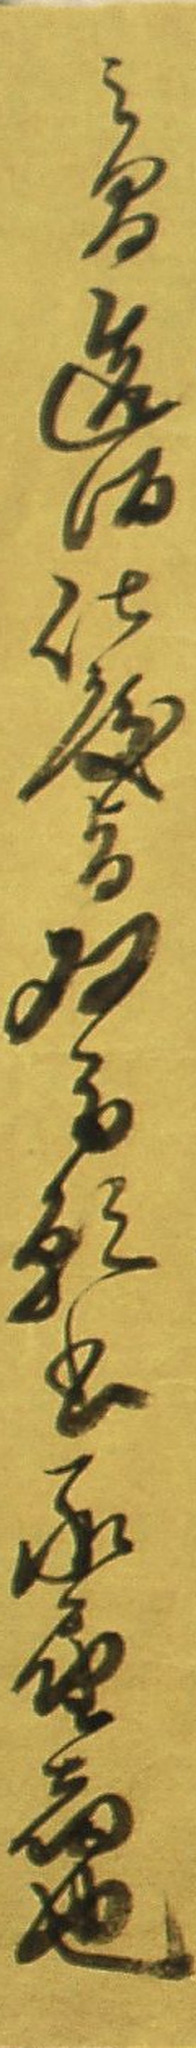之間造酒仕度旨双方願出承届者也
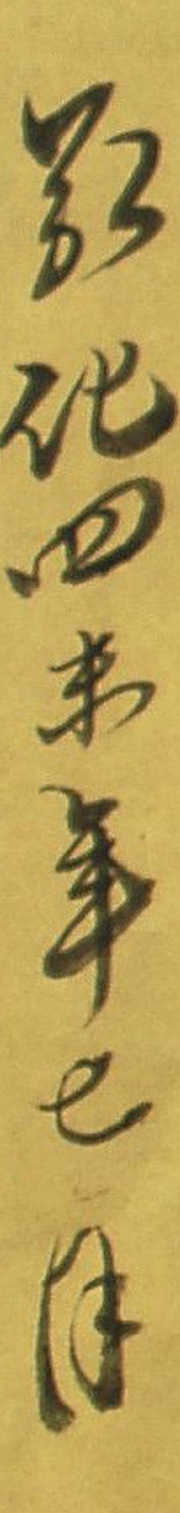弘化四未年七月

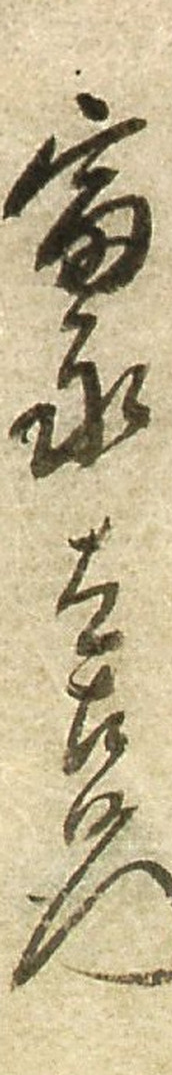富永太左衛門
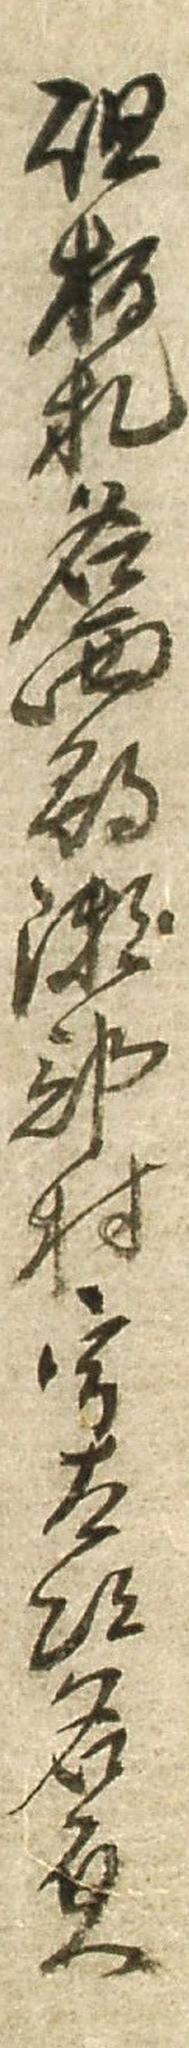但板札名西郡瀬部村宇太次名
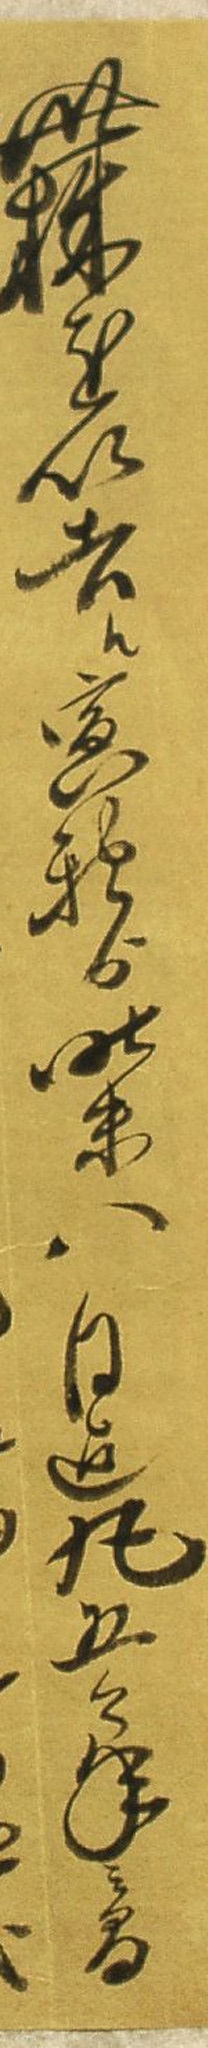此株を以去る寅秋より昨未八月迄丸五ヶ年之間
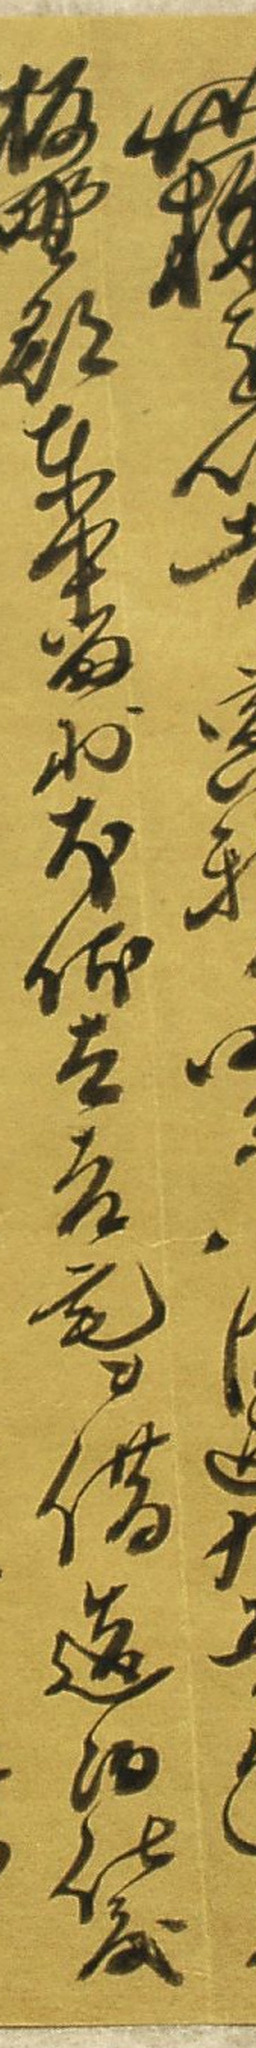板野郡東中冨村犬伏太吉宅を借造酒仕度
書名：名東郡中酒株並造酒屋軒数取調帳
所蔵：鳴門教育大学 Naruto University of Education
